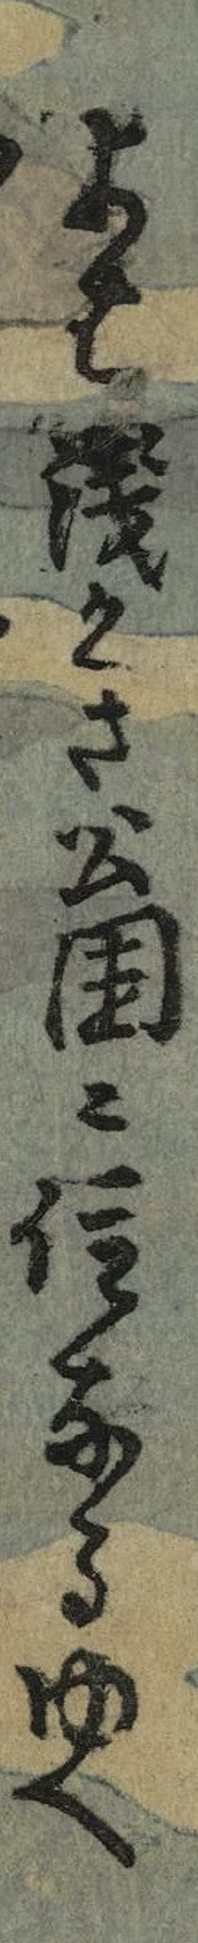よは浅くさ公園ニ住なるゆへ
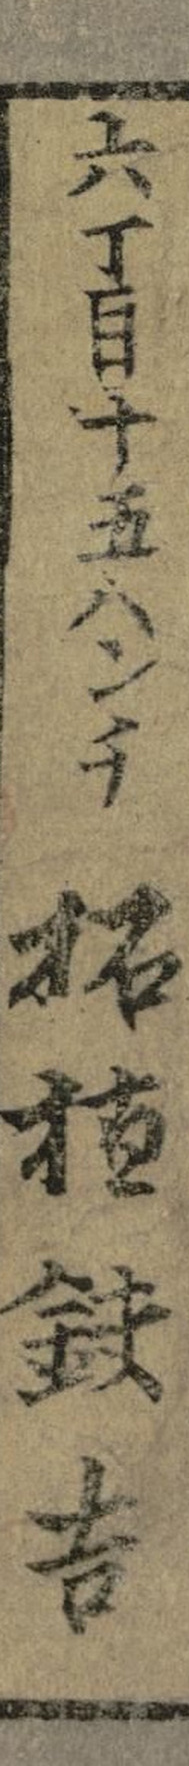六丁目十五バンチ柘植鉄吉
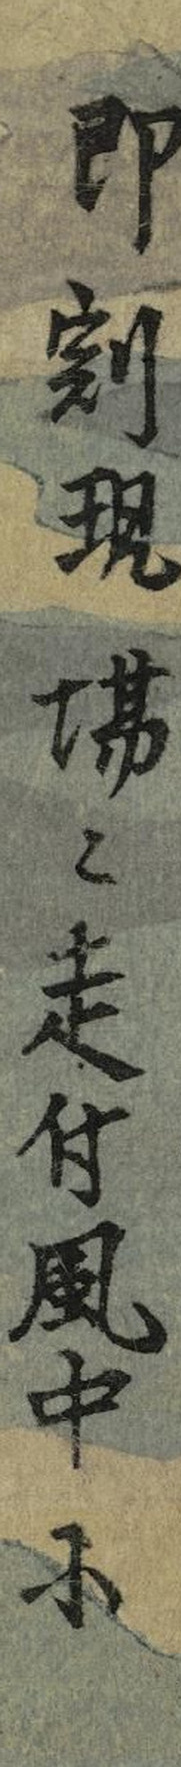即刻現場ニ走付風中に
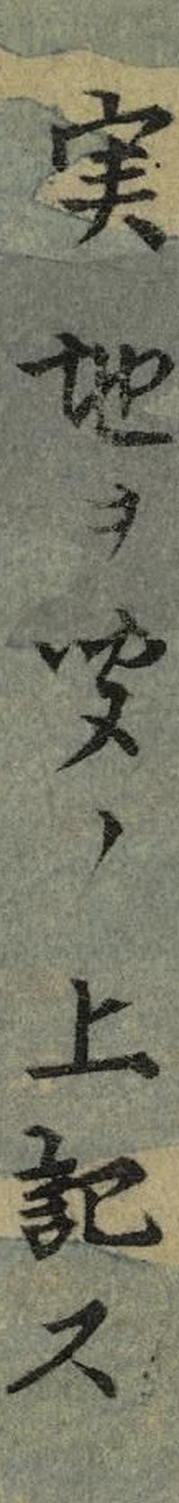実地ヲ聞ノ上記ス
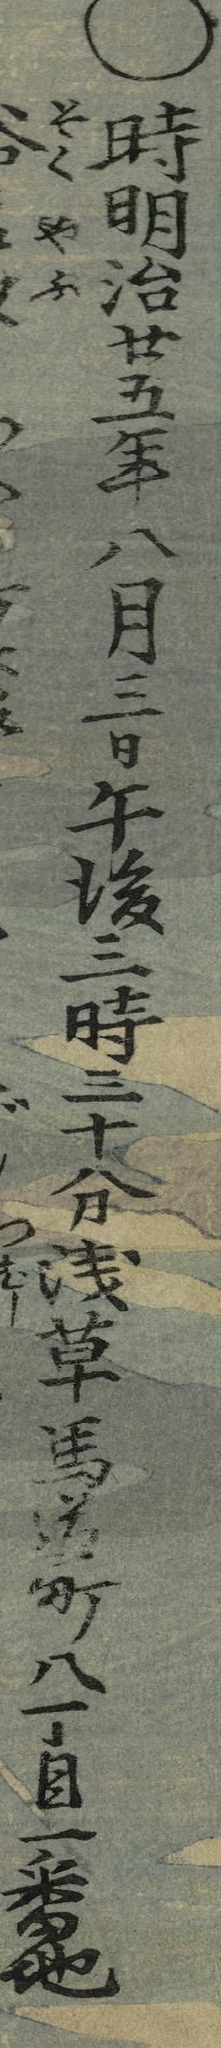〇時明治廿五年八月三日午後三時三十分浅草馬道町八丁目一番地
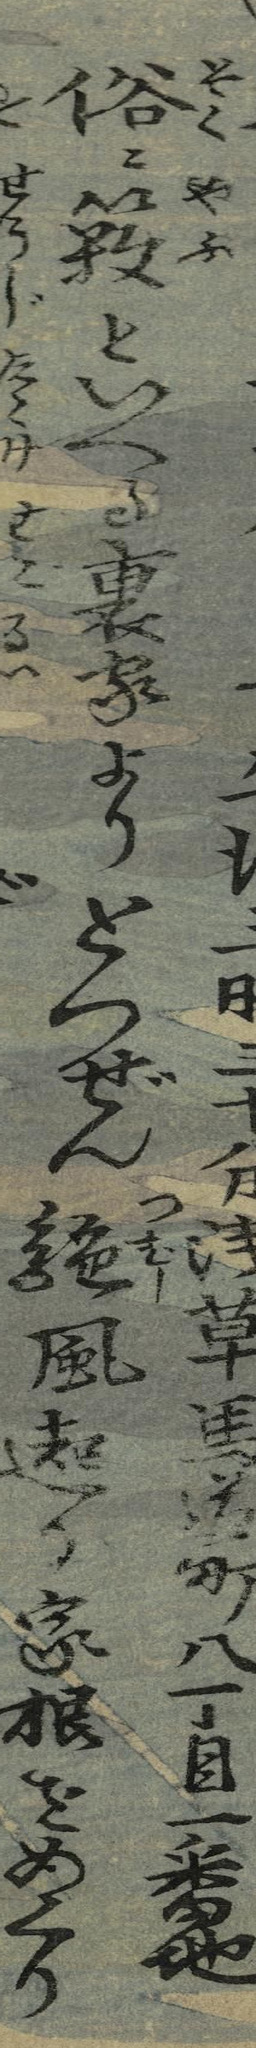俗二藪といへる裏家よりとつぜん旋風起り家根をめくり
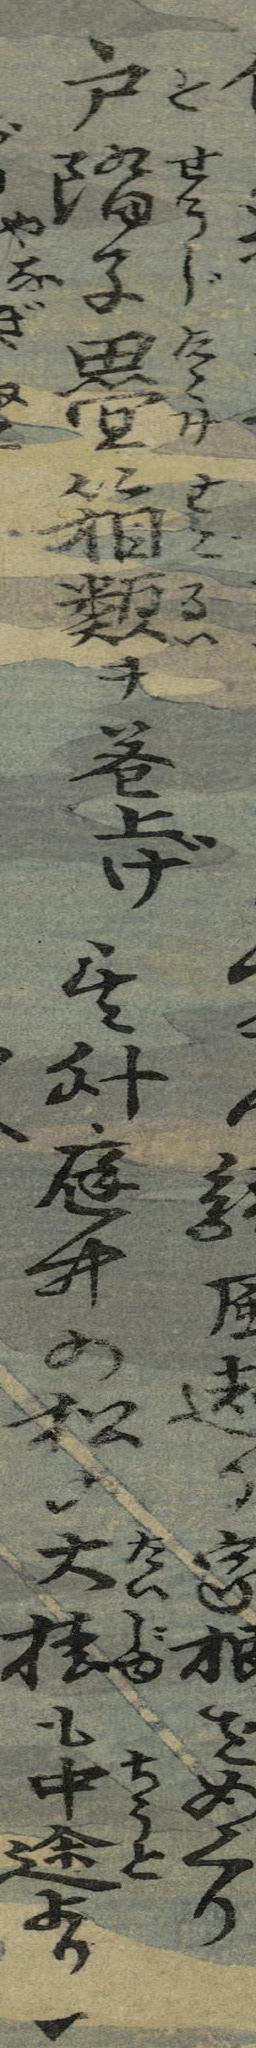戸障子畳箱類ヲ巻上げ其外庭中の松の大樹も中途より
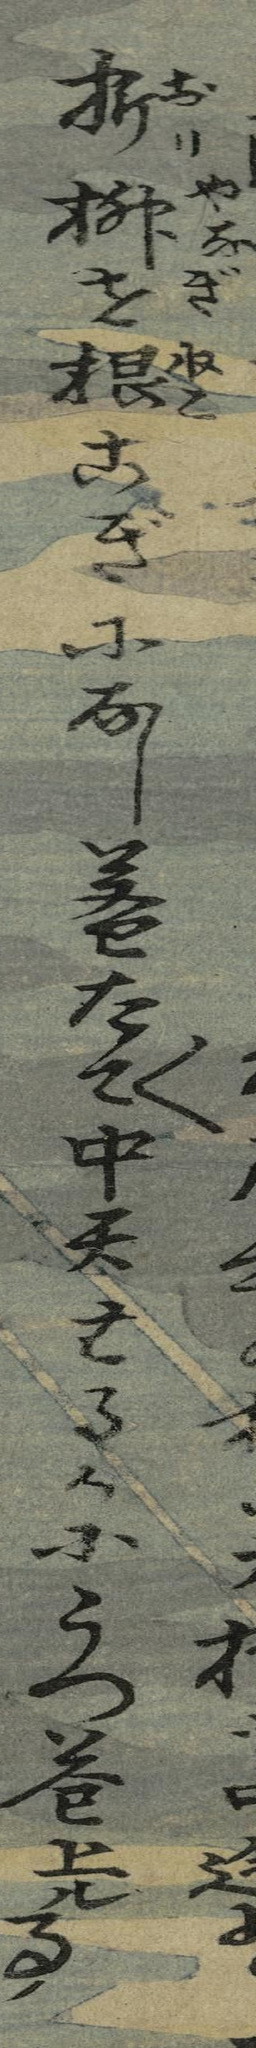折柳を根こぎになし卷たて〳〵中天はるかにこつ巻上ル事
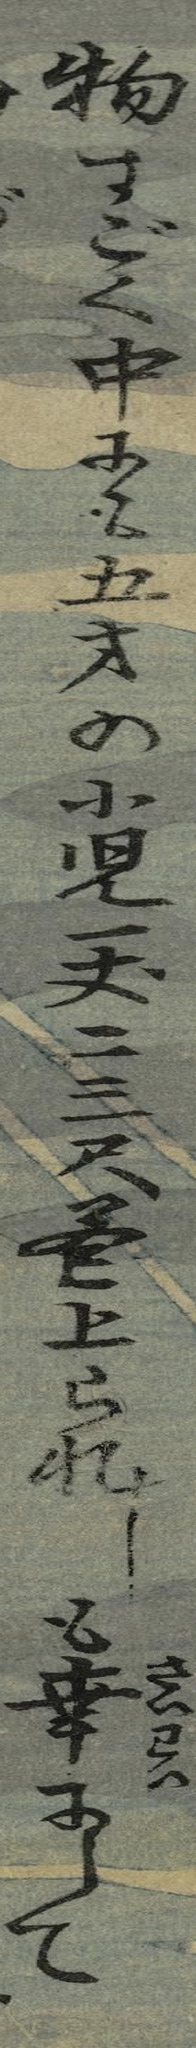物すごく中にも五才の小児一丈二三尺巻上られしも幸にして
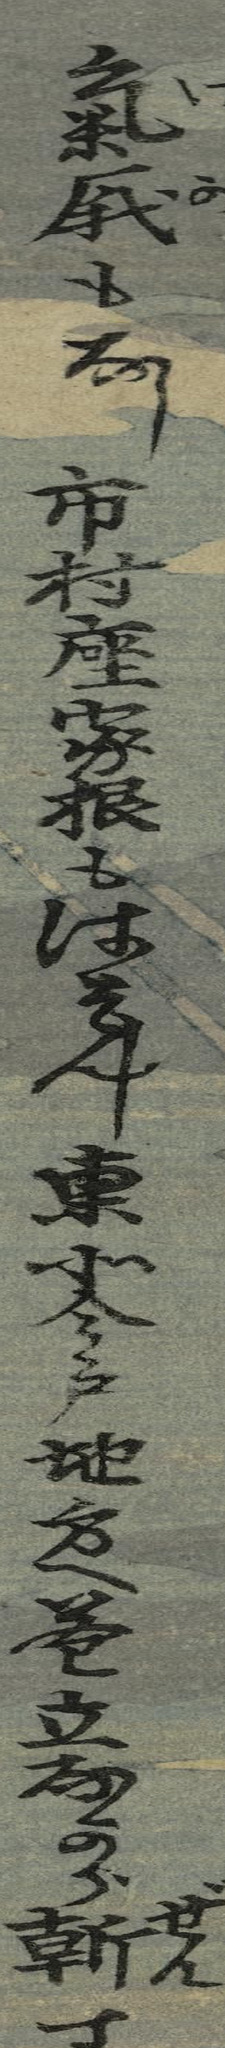気我もなし市村座家根もはそんし東北今戸地方へ巻立なから漸す
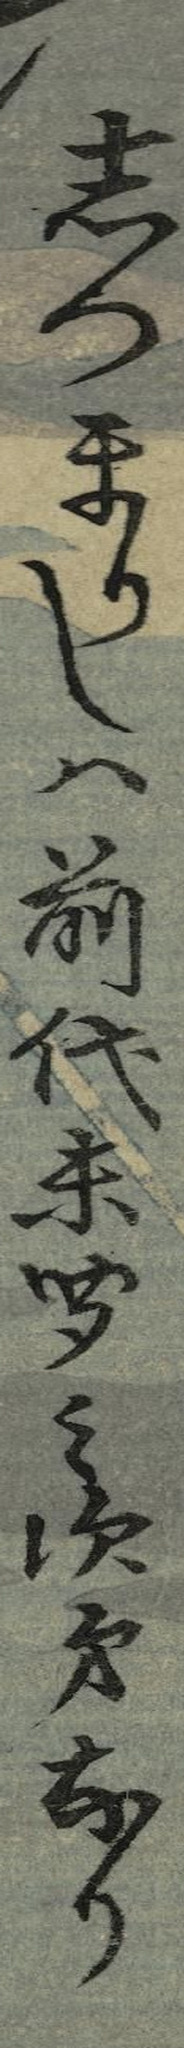しつまりしハ前代未聞之次第なり
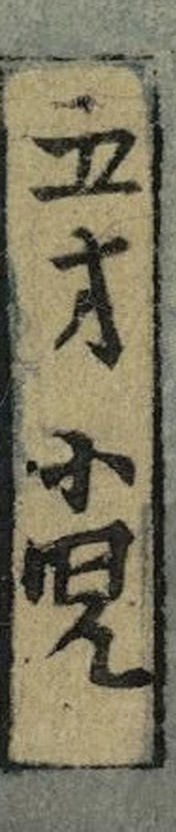五才小児
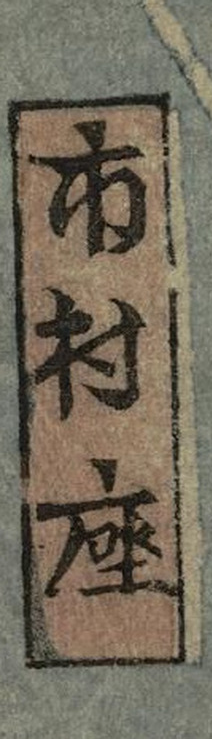市村座
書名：大旋風
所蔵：東京大学地震研究所図書室 Earthquake Research Institute Library, The University of Tokyo, JAPAN
